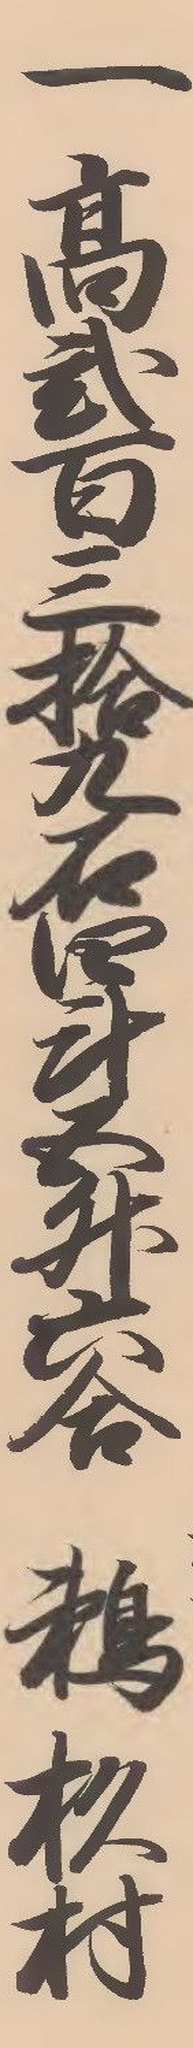一高弐百三拾九石四斗五升六合鵜杉村
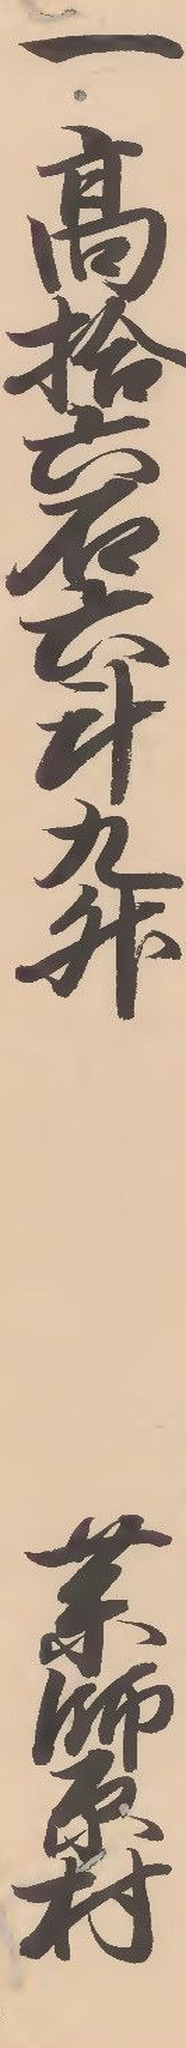一高拾六石六斗九升薬師原村

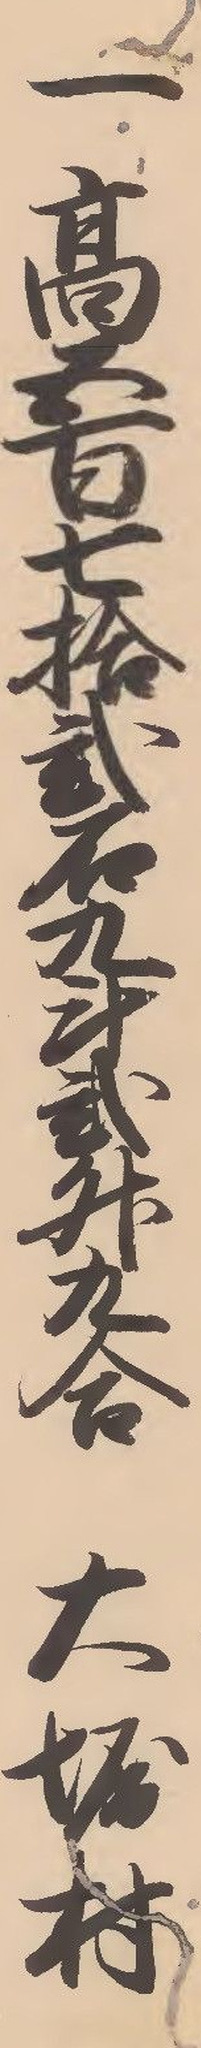一高五百七拾弐石九斗弐升九合大堀村
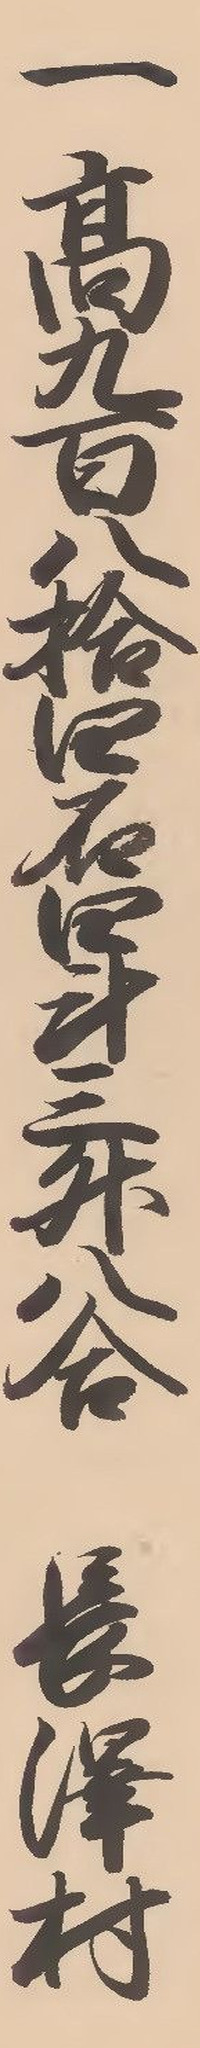一高九百八拾四石四斗三升八合長沢村
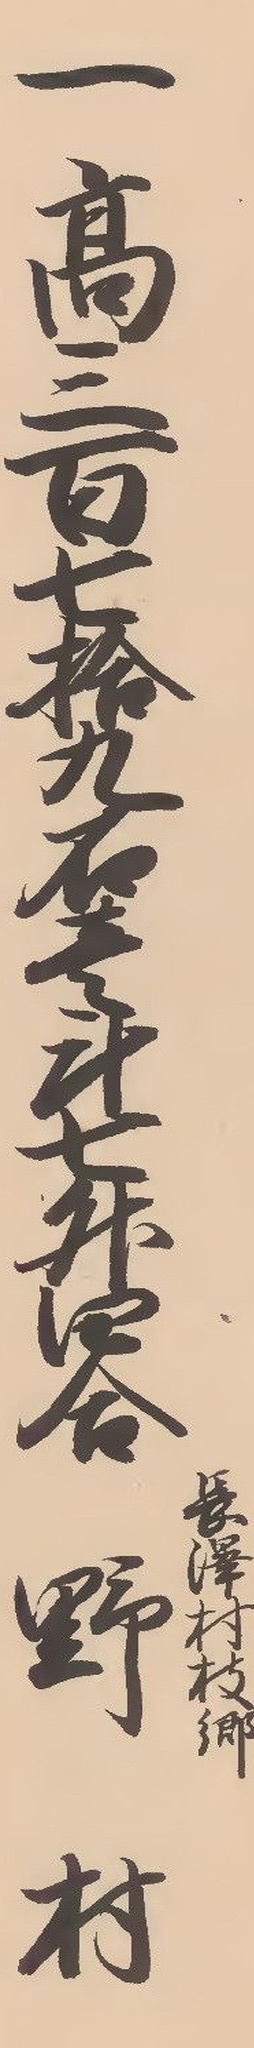一高三百七拾九石壱斗七升四合野村
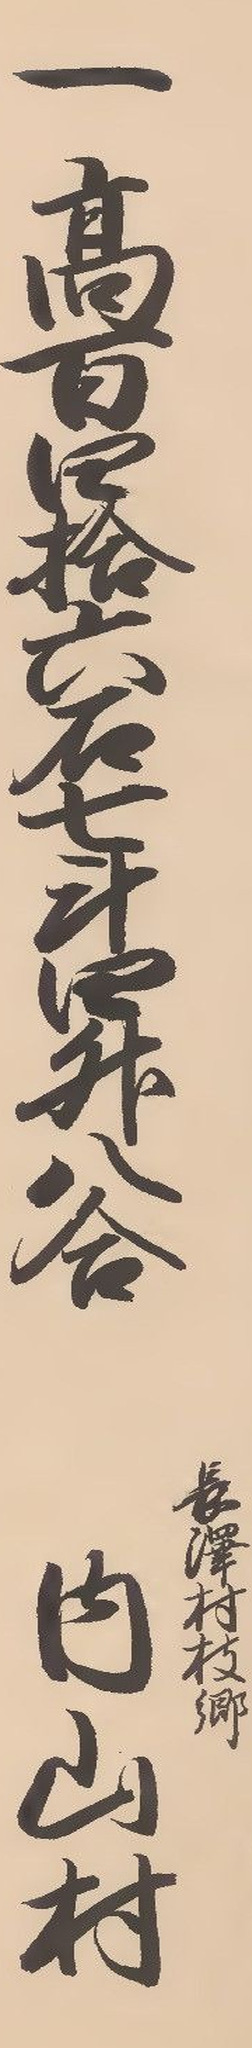一高百四拾六石七斗四升八合内山村
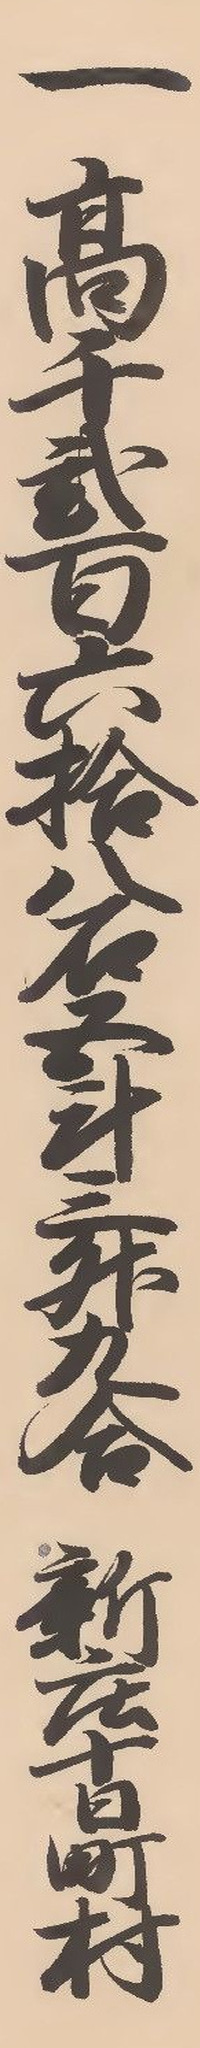一高千弐百六拾八石五斗三升九合新庄十日町村
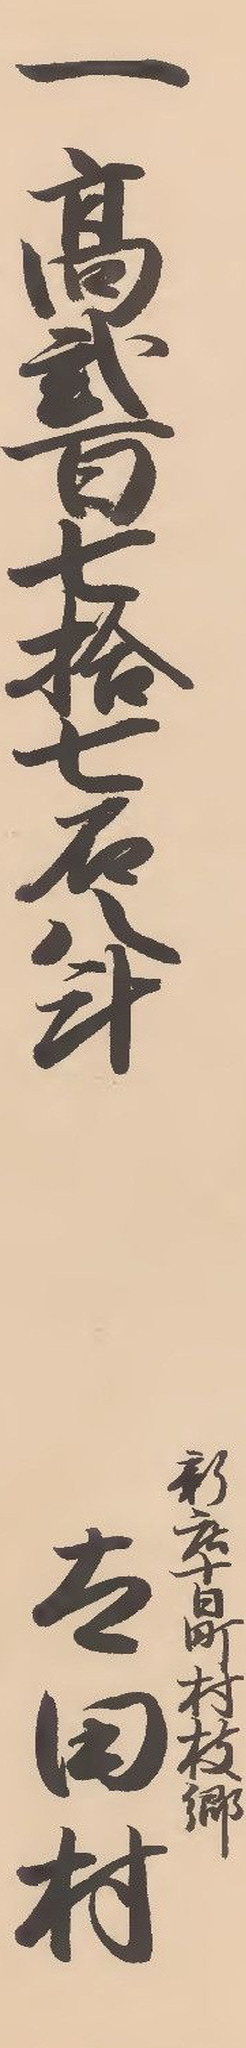一高弐百七拾七石八斗太田村
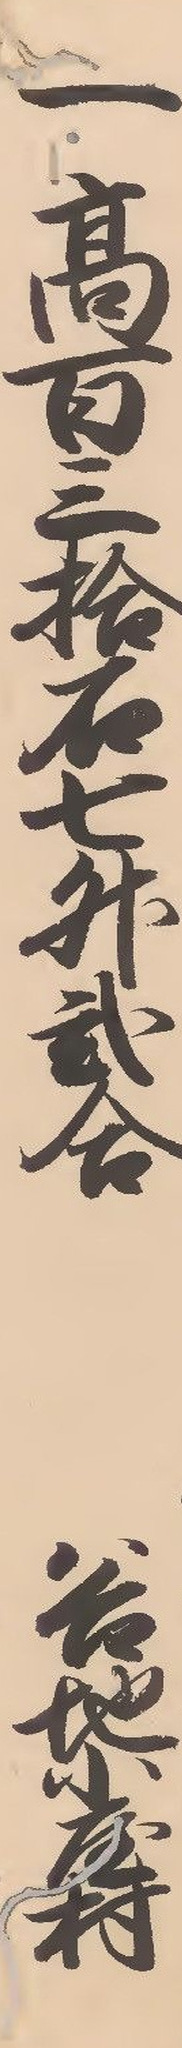一高百三拾石七升弐合谷地小屋村

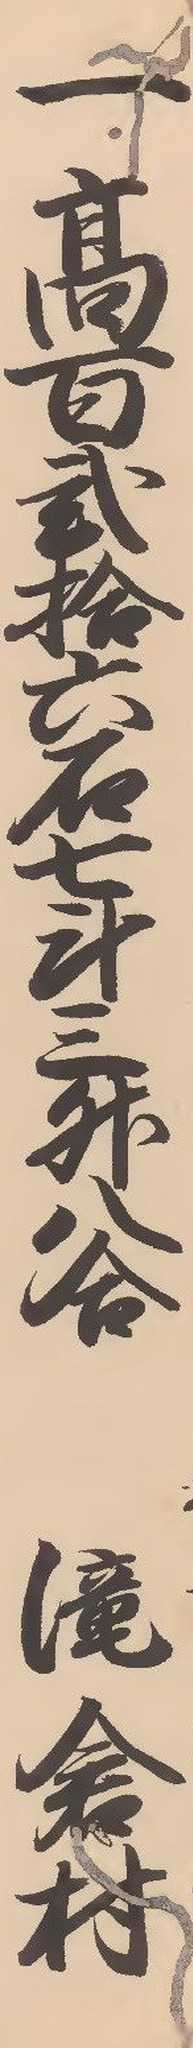一高百弐拾六石七斗三升八合滝倉村
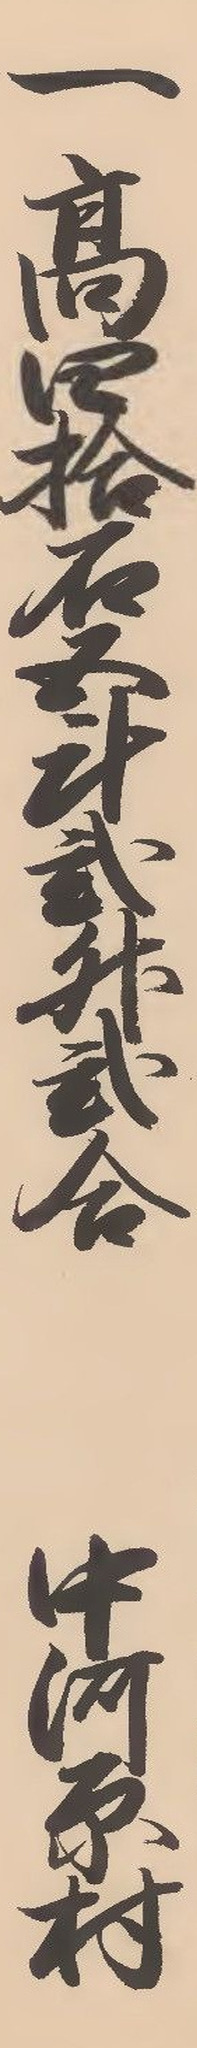一高四拾石五斗弐升弐合中河原村
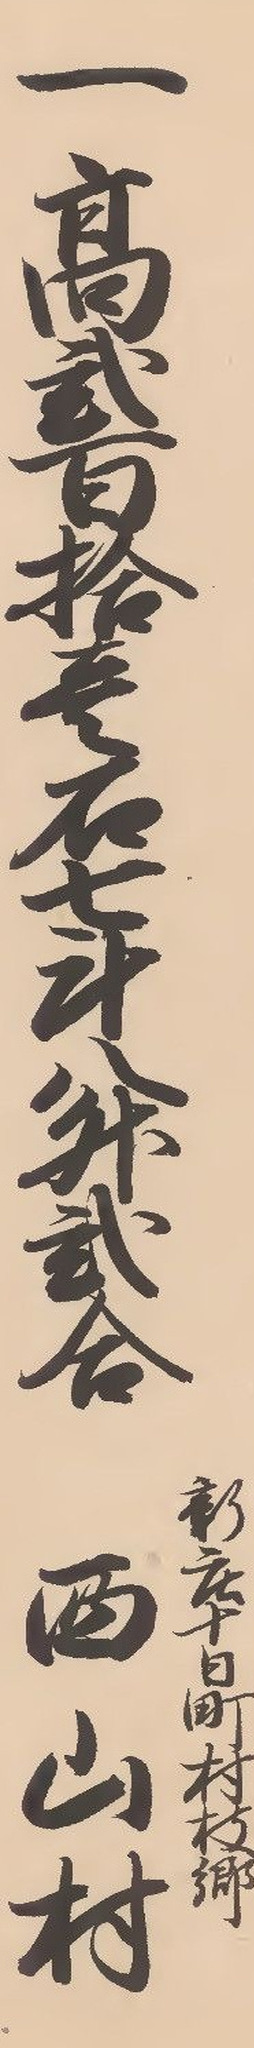一高弐百拾壱石七斗八升弐合西山村
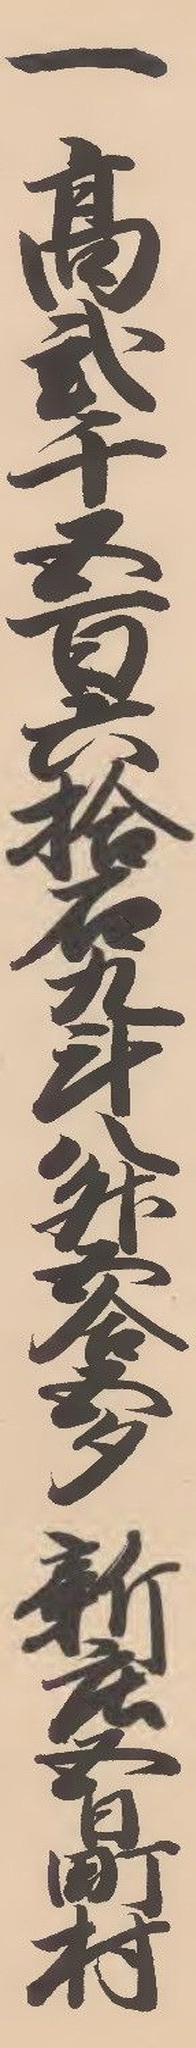一高弐千五百六拾石九斗八升五合五勺新庄五日町村
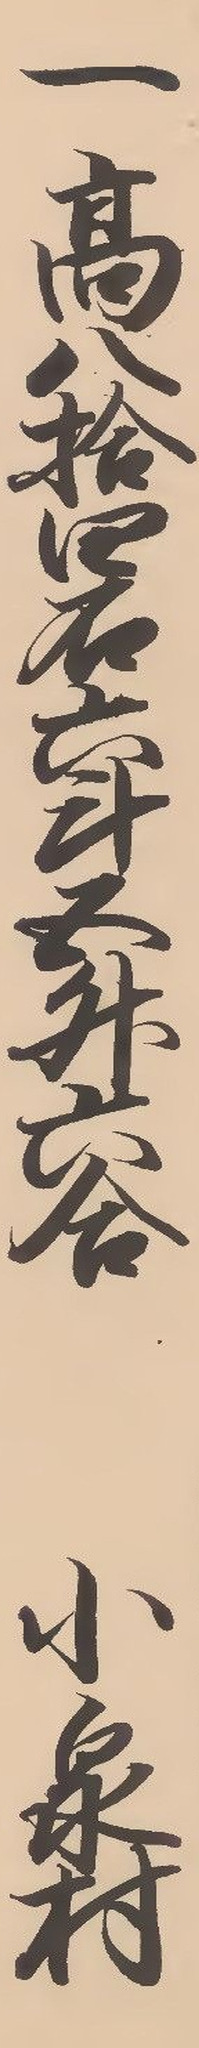一高八拾四石六斗五升六合小泉村
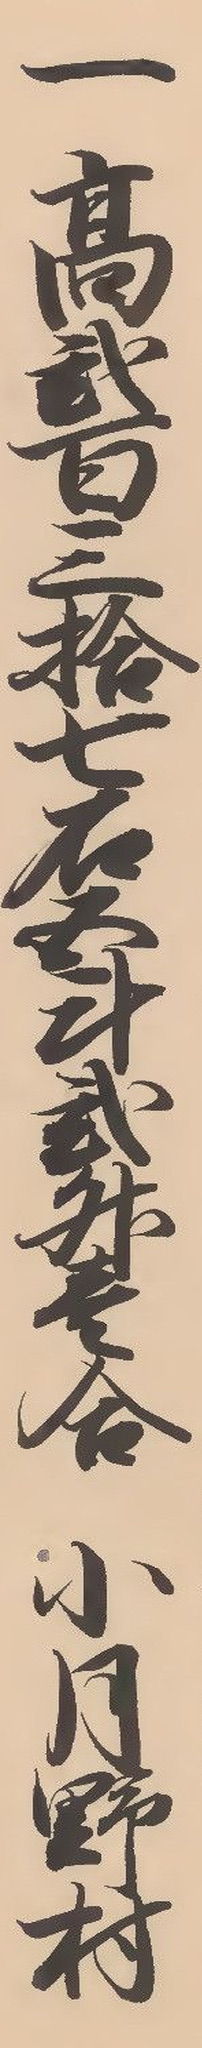一高弐百三拾七石五斗弐升壱合小月野村
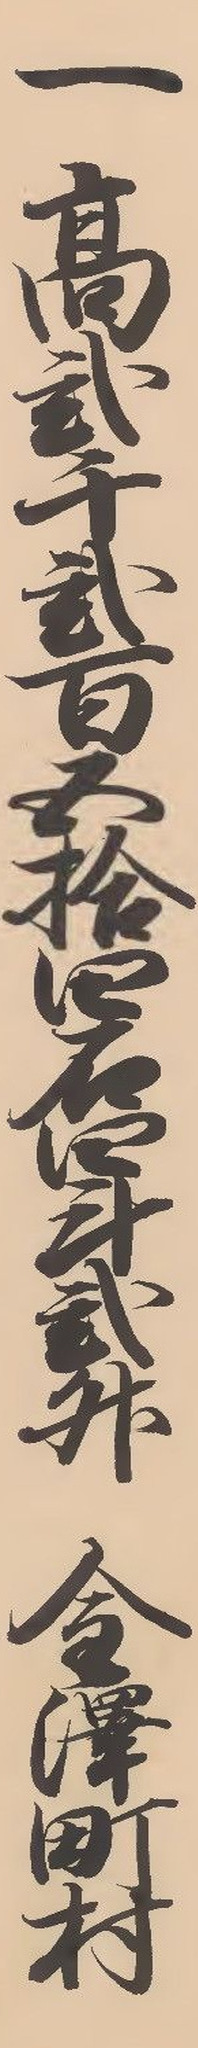一高弐千弐百五拾四石四斗弐升金沢町村
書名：出羽国郷帳　３
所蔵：国立公文書館 National Archives of Japan
